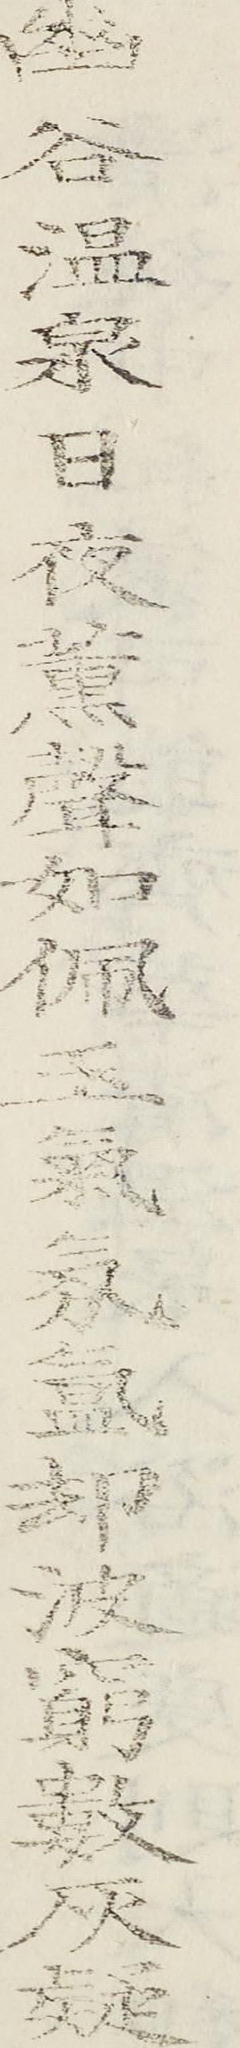幽谷温泉日夜薰声如佩玉気氛氳却波窮数灰疑
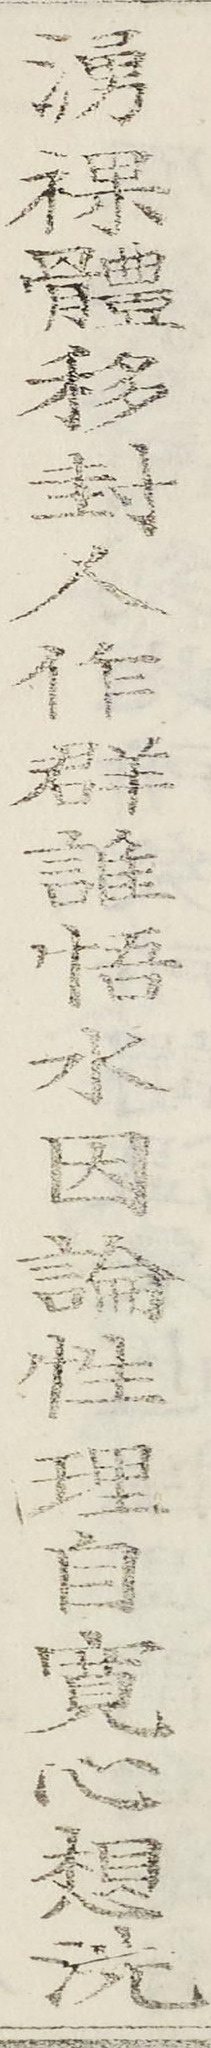湧裸体移封人作群誰悟水因論性理自寛心想洗
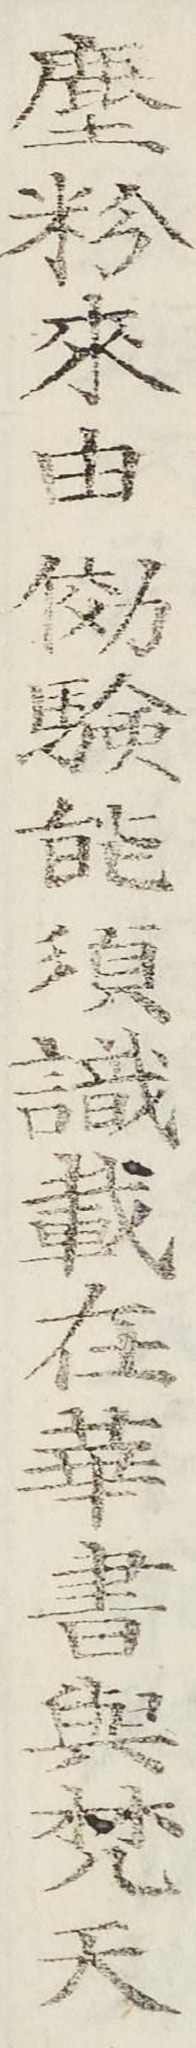塵粉来由効験能須識載在華書与梵天
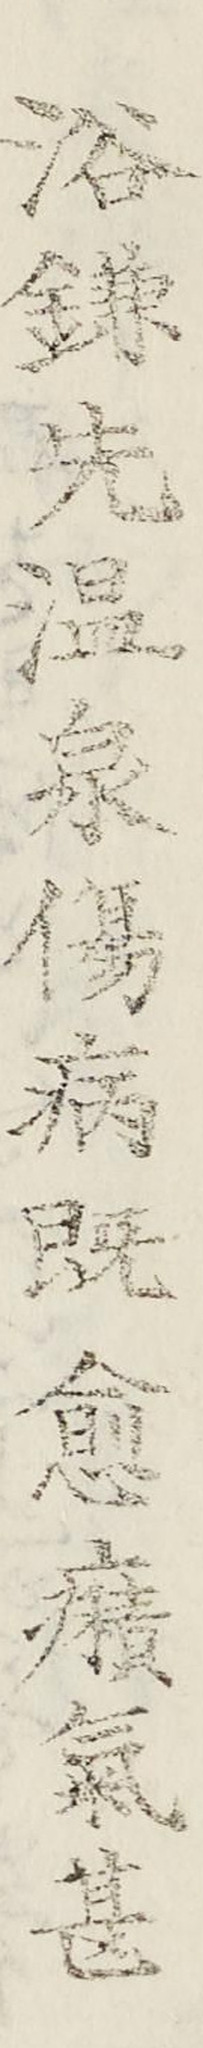浴鎌先温泉傷病既愈疾気甚
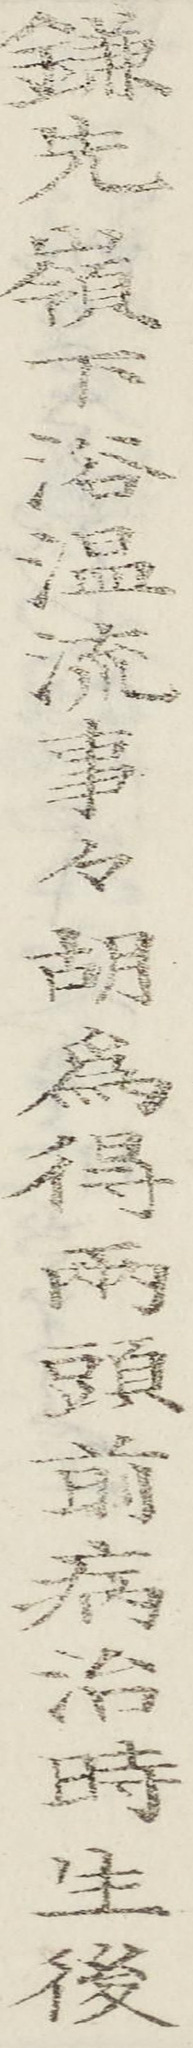鎌先嶺下浴温流事々胡為得両頭前病治時生後
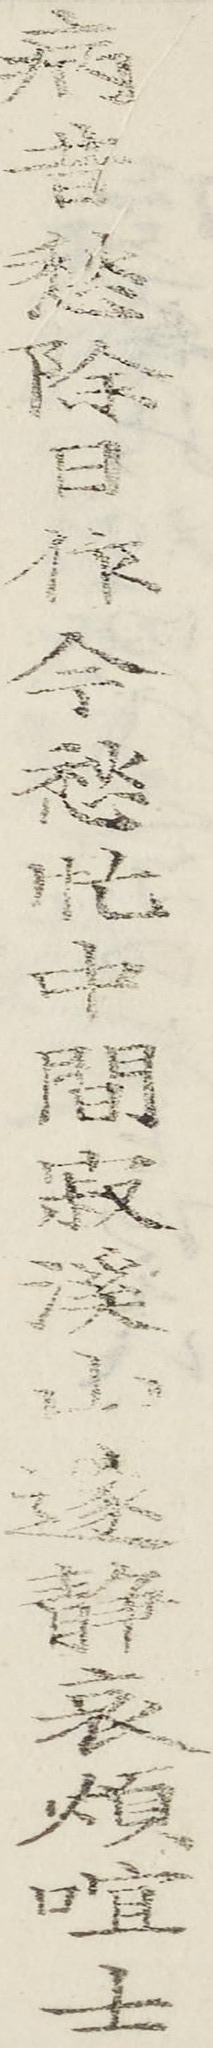病昔愁除日作今愁忙中間寂溪山邃静哀煩喧士
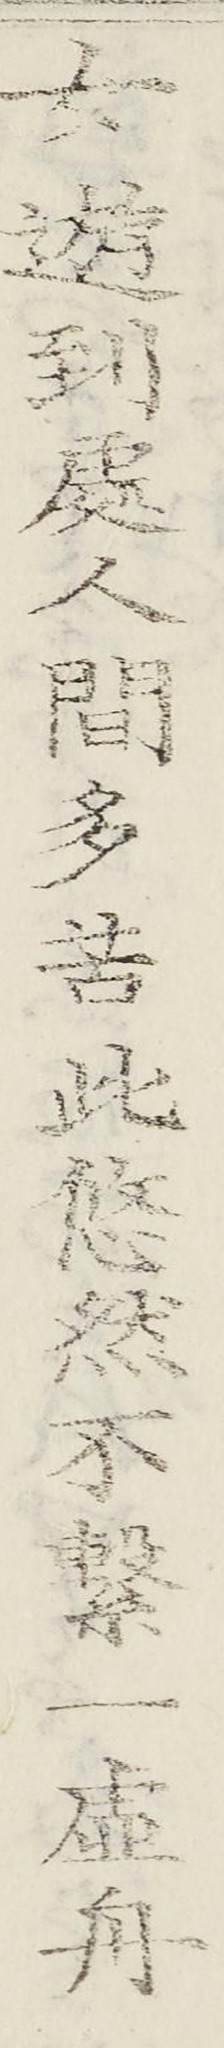女遊到処人間多苦此悠然不繋一虚舟
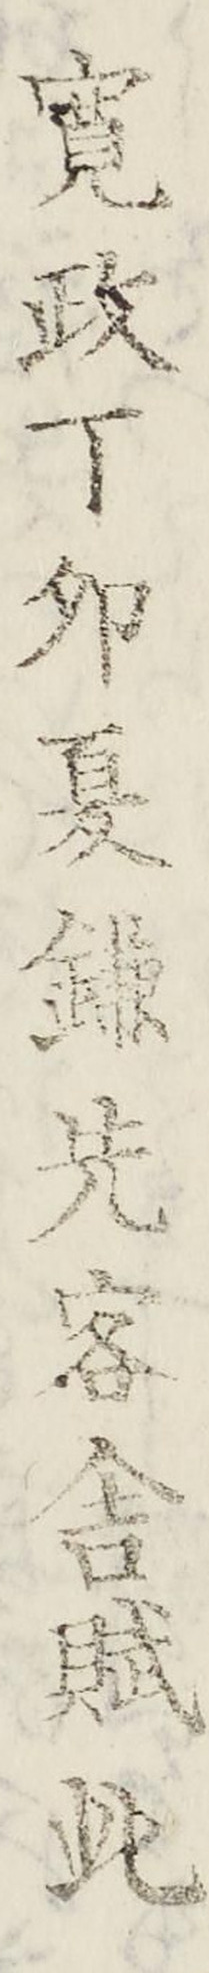寛政丁卯夏鎌先客舎賦此
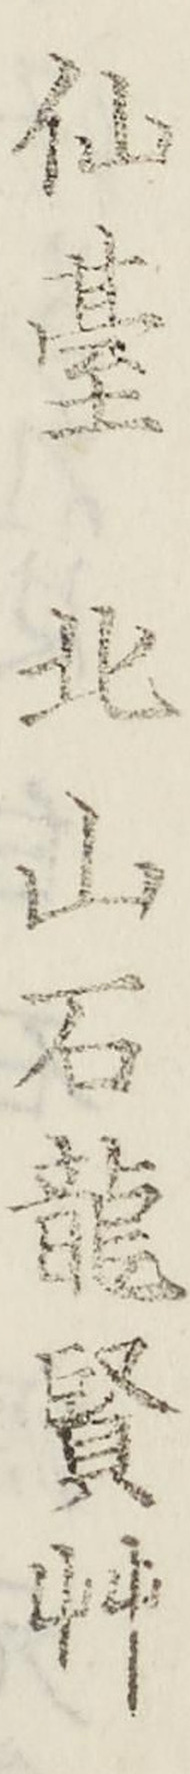仙台北山石龍賢艸
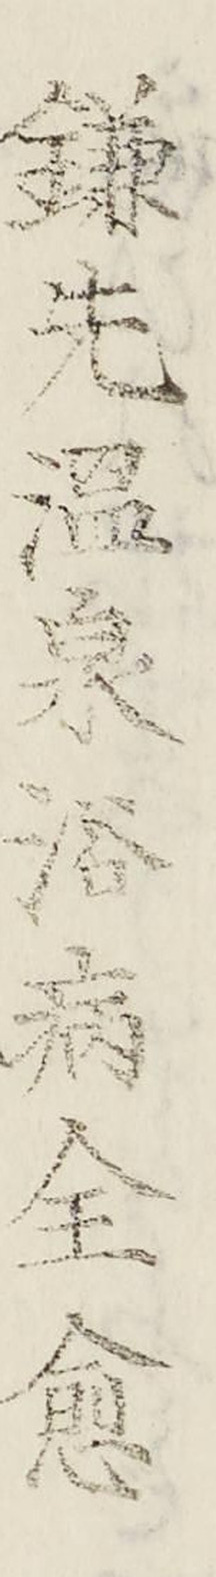鎌先温泉浴病全愈
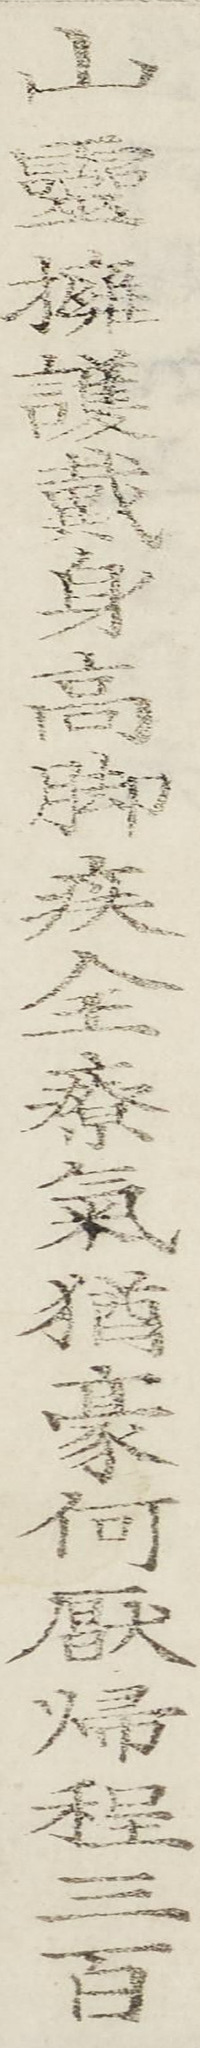山霊擁護戴身高脚疾全療気猶豪何厭帰程,三百
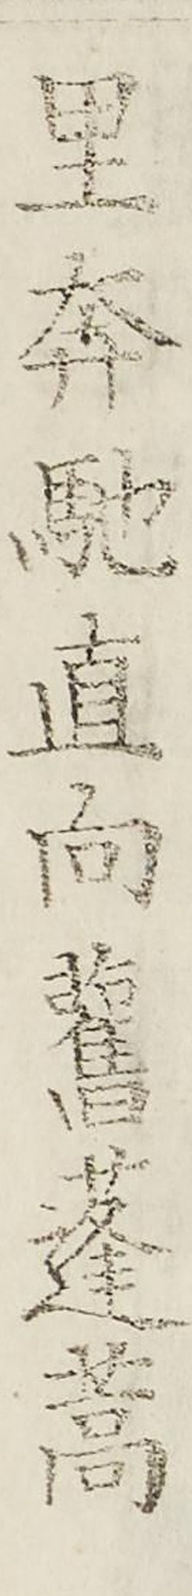里奔馳直向雚蓬蒿
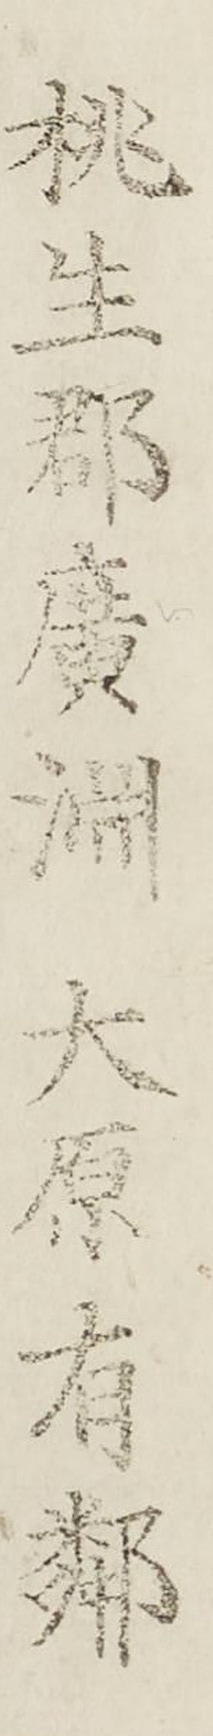桃生郡広淵大原有鄰

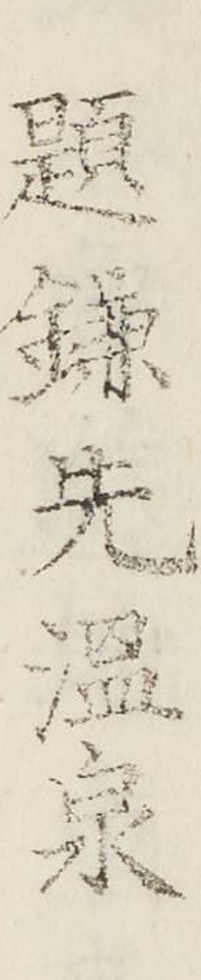題鎌先温泉
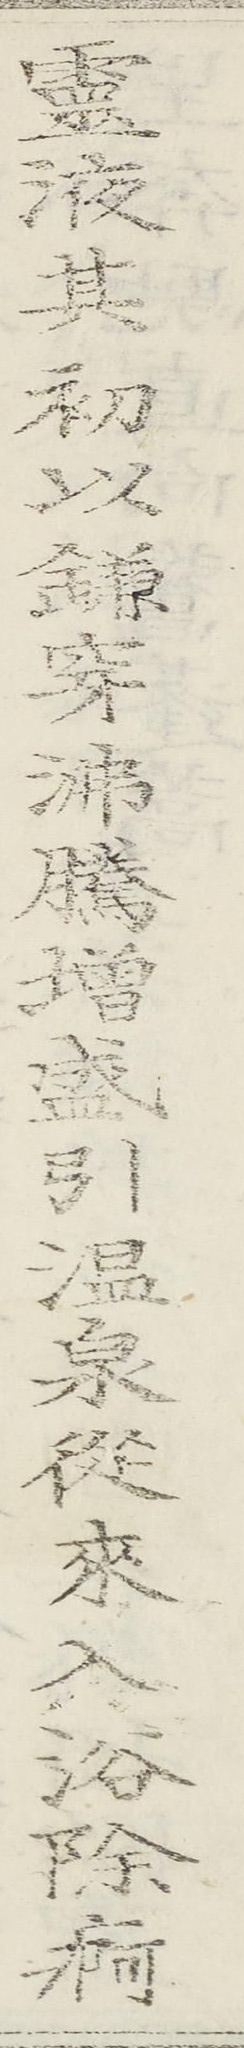霊液其初以鎌穿沸騰増盛引温泉従来入浴除痾
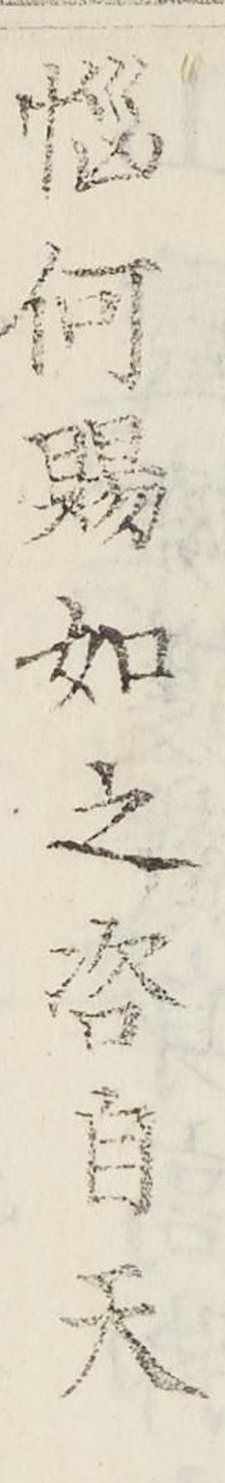悩何賜如之咨自天
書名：鎌先温泉由來記
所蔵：東京大学地震研究所図書室 Earthquake Research Institute Library, The University of Tokyo, JAPAN
